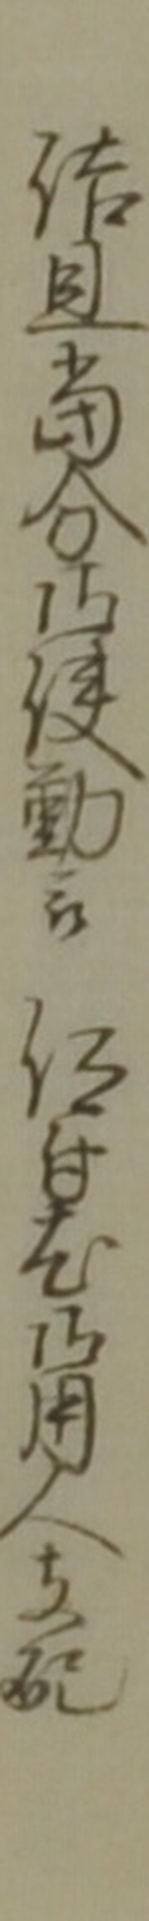詰且当分御使勤被仰付尤御用人支配
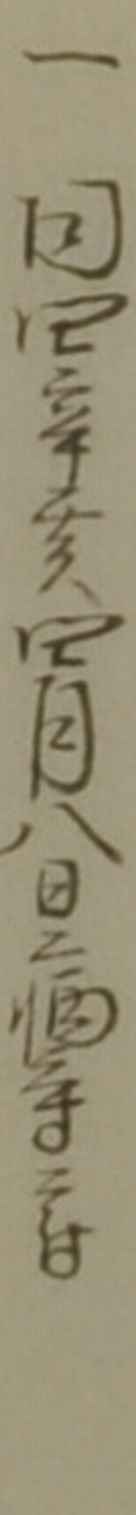一同四辛亥四月八日病気ニ付

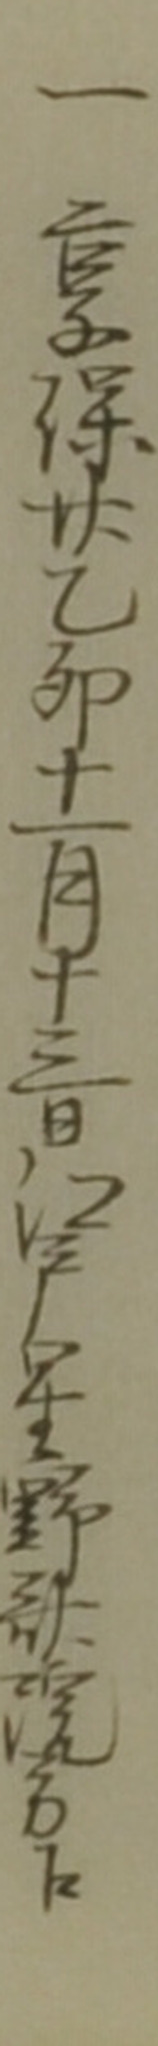一享保廿乙卯十一月十三日江戸星野斉院方江
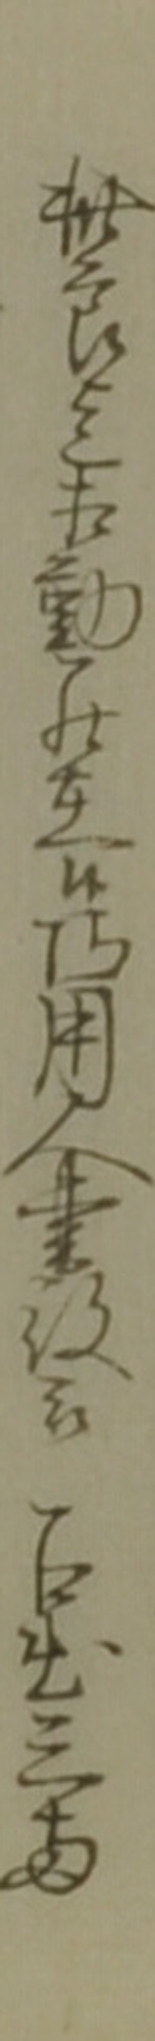此節迄相勤罷在候御用人書役被召出三両
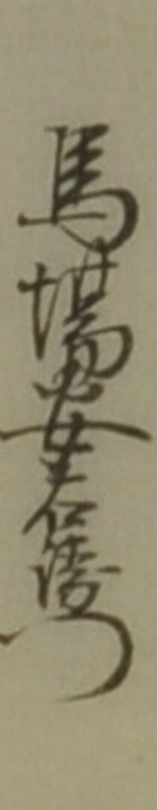馬場安右衛門
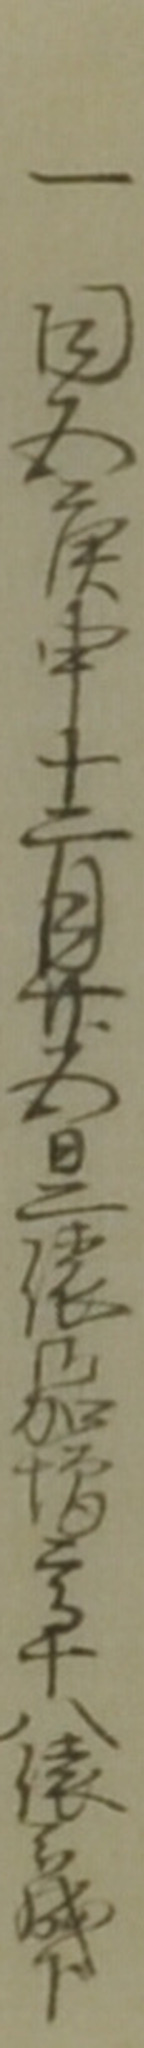一同五庚申十二月廿五日二俵御加増高十八俵被成下
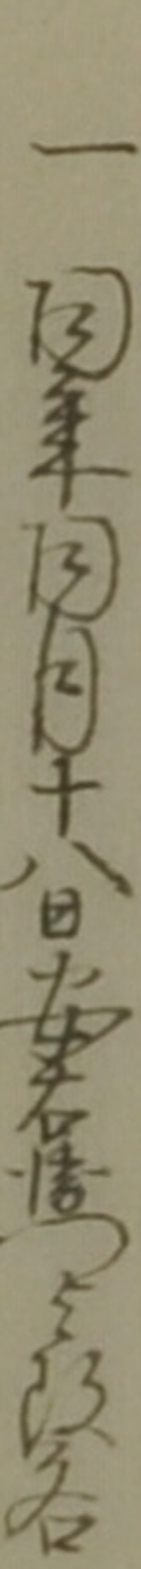一同年同月十八日安右衛門と改名
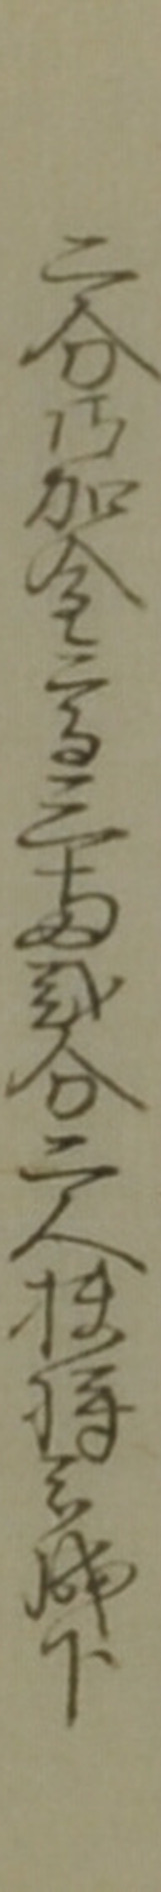二分御加金高三両弐分二人扶持被成下
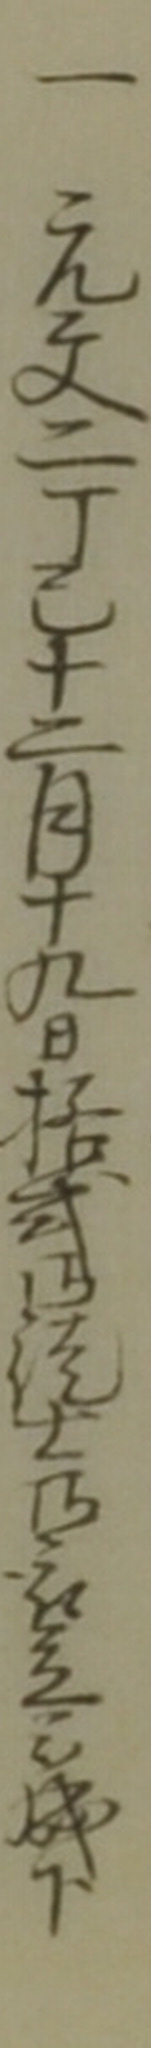一元文二丁巳十二月十九日格式御徒士御取立被成下
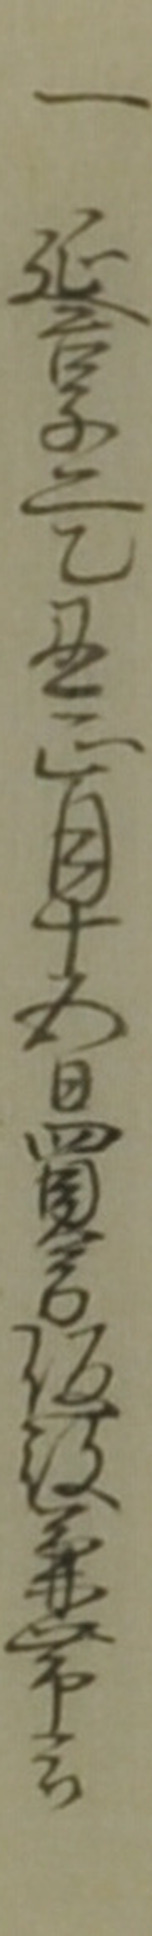一延享二乙丑正月十五日買方仮役兼帯被
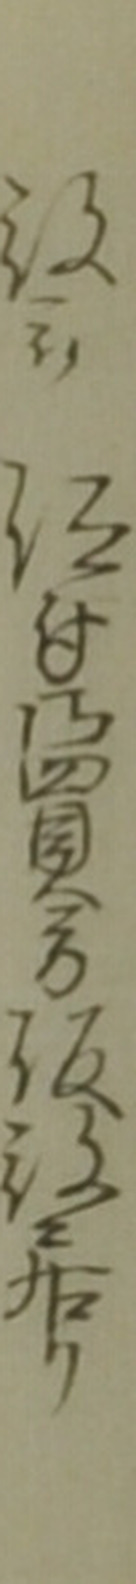役被仰付御買方仮役居り
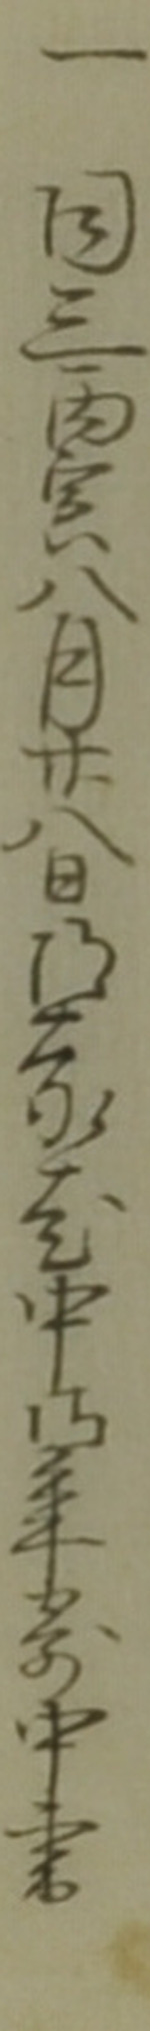一同三丙寅八月廿八日御家老中御年寄中書
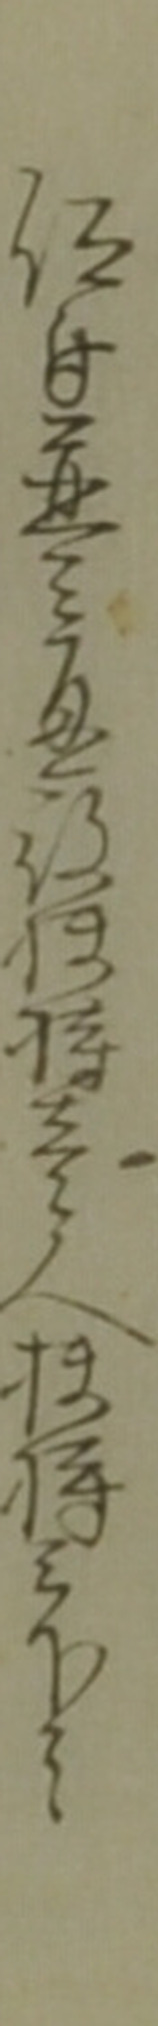仰付並之通役扶持壱人扶持被下之
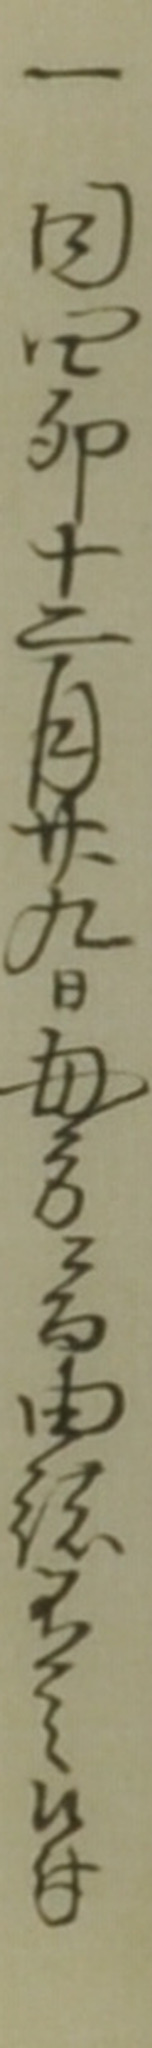一同四卯十二月廿九日母方ニ而由緒有之候付
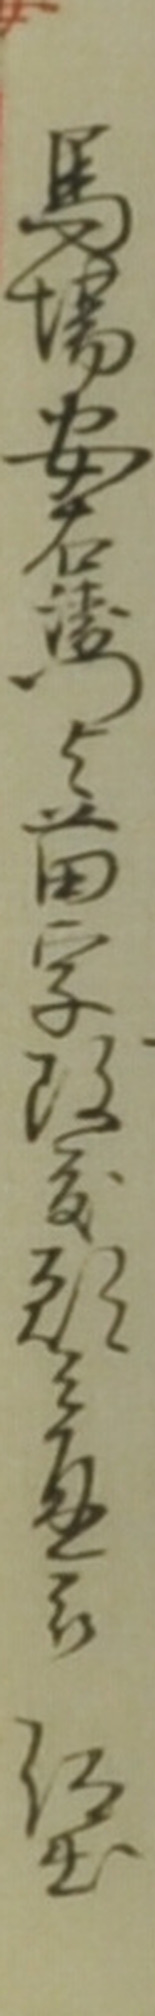馬場安右衛門と苗字改度願之通被仰出

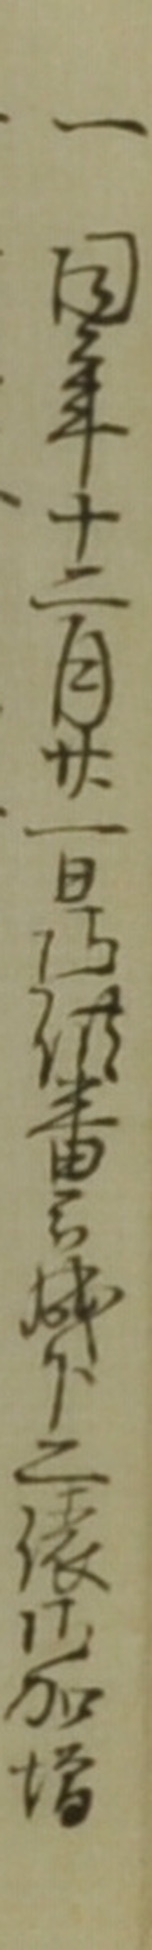一同年十二月廿一日御供番被成下二俵御加増
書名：無足廃家（弐）
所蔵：伊那市立高遠町図書館・合同会社AMANE
